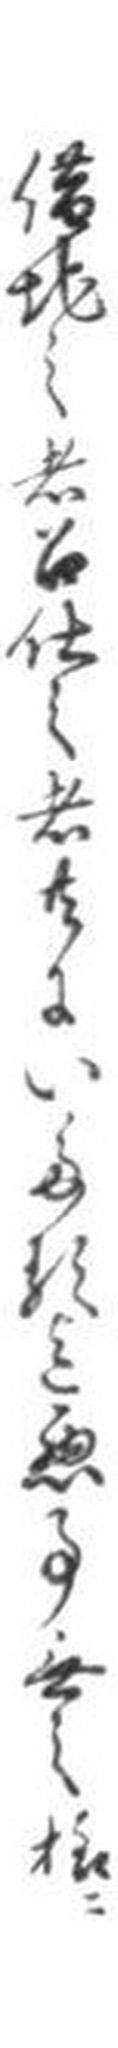借地之者召仕之者共にいたる迄悪事無之様ニ
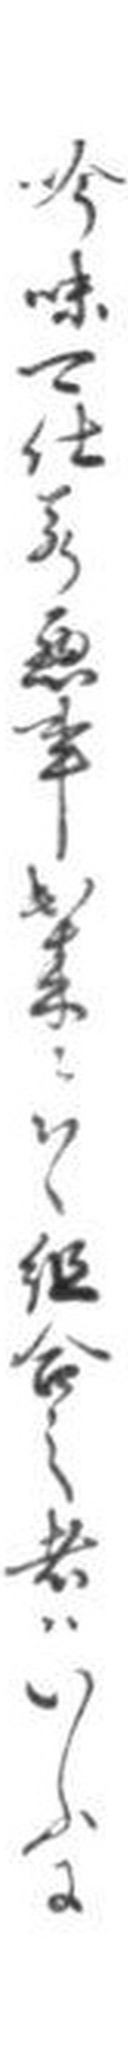吟味可仕若悪事出来候ハヽ組合之者ハいいふに
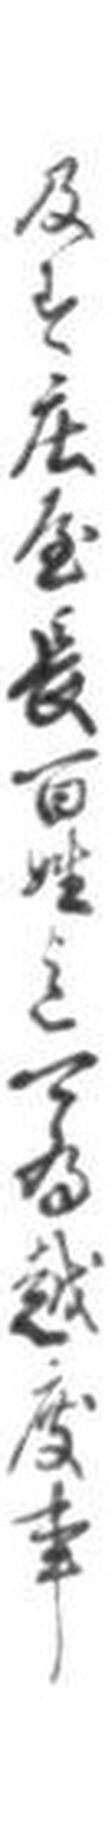及す庄屋長百姓迄可為越度事
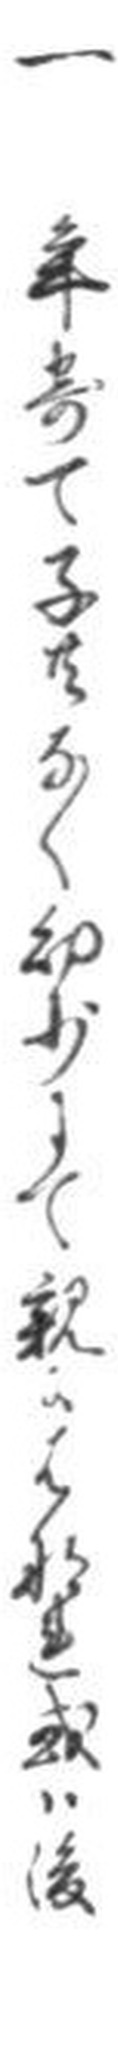一年寄て子供なく幼少にて親にはなれ或ハ後
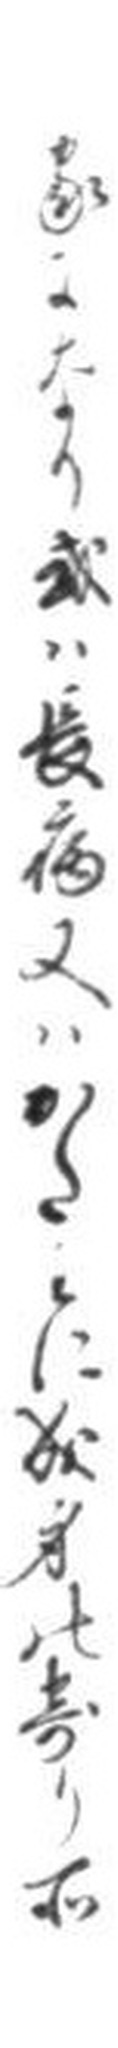家になり或ハ長病又ハかたわに成身の寄り所
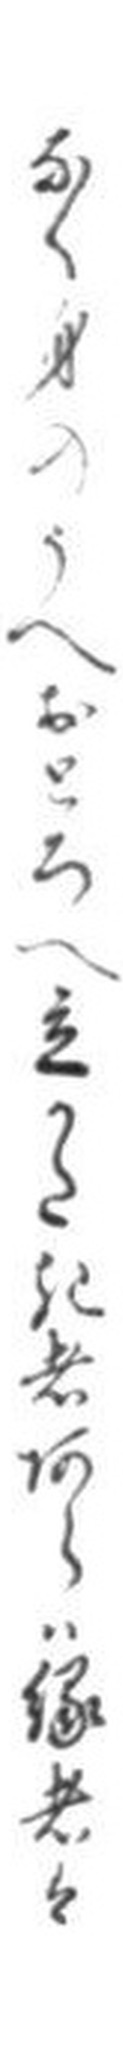なく見のうへおとろへ立かたき者あらハ縁者有
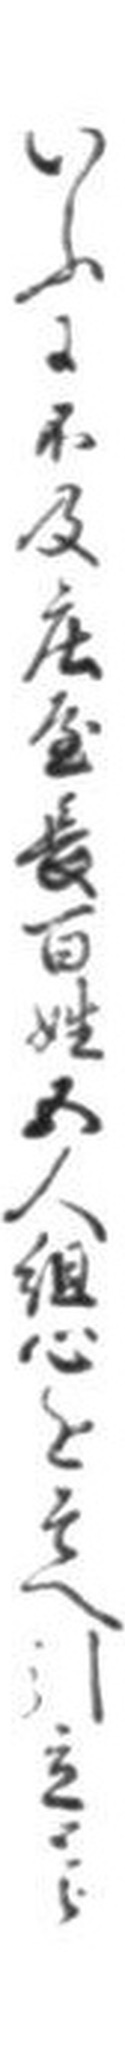いふに不及庄屋長百姓五人組心をそへ引立とら
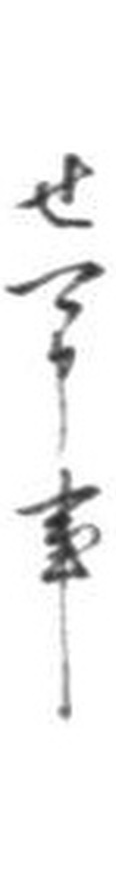せ可申事
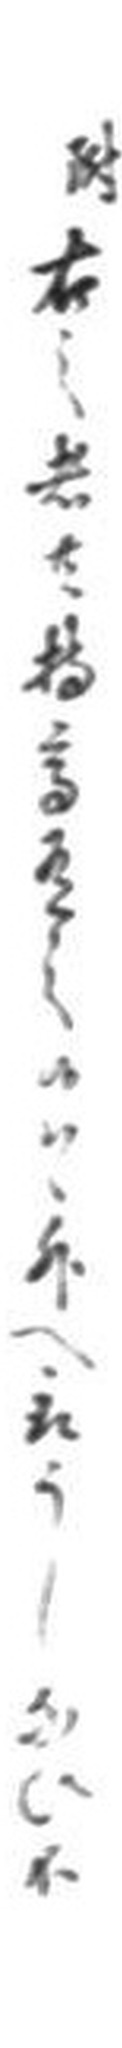右之者共持高有之候ハヽ外へ取うしなひ不
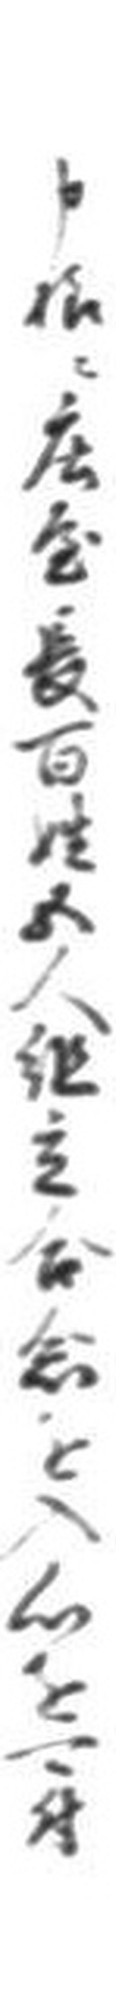申様ニ庄屋長百姓五人組立合念を入心を可付
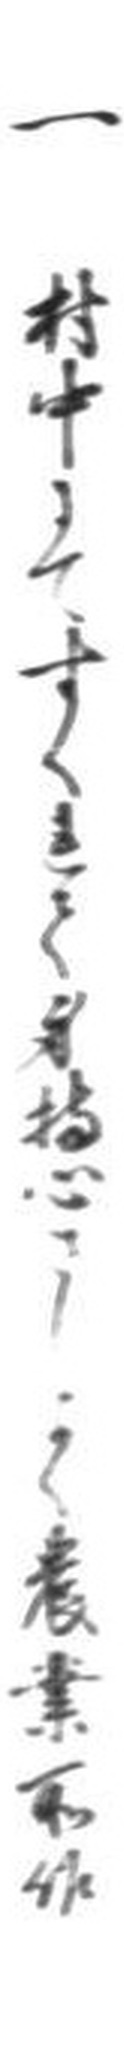一村中にてすくれて身持心さして農業所作
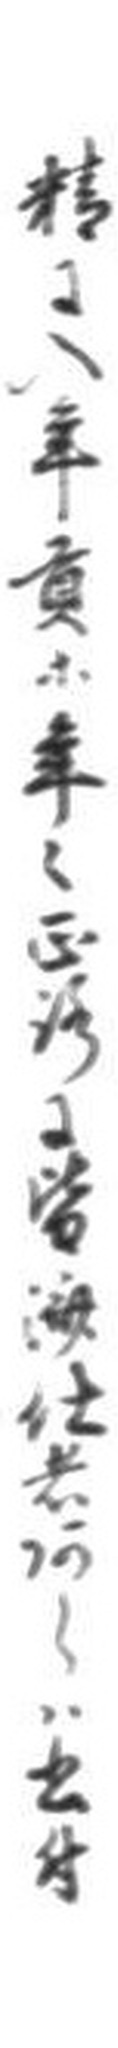精に入年貢等年々正路に皆済仕者あらハ書付
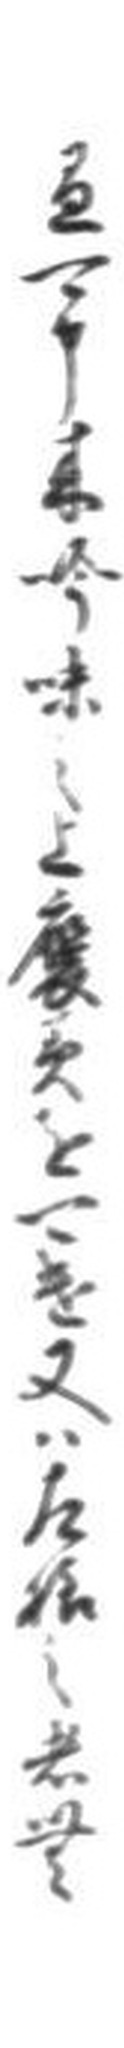置可申来吟味之上褒美を可遣又ハ左様之者無
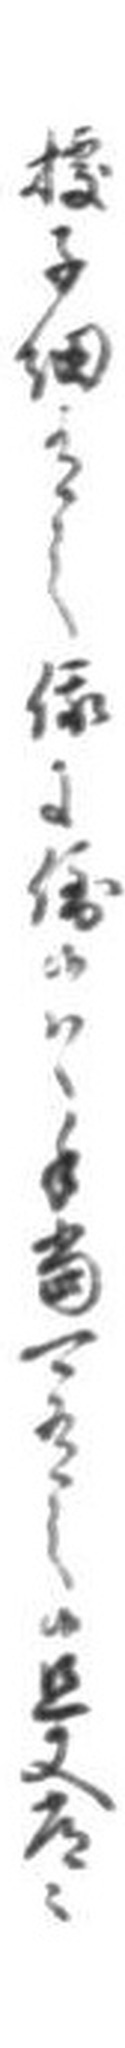拠子細有之俄に倒候ハヽ手当可有之候且又道々
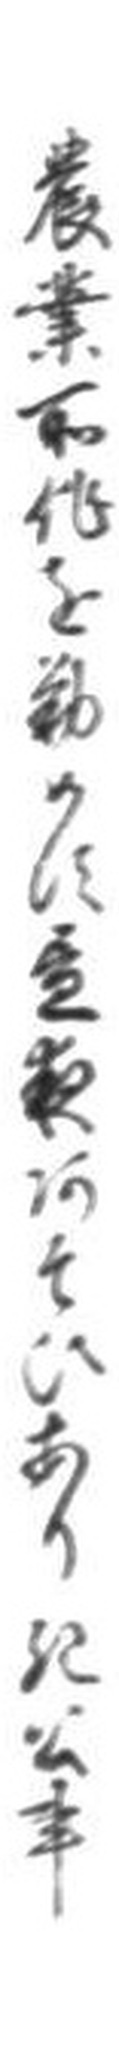農業所作を勤めめす昼夜あそひありき公事
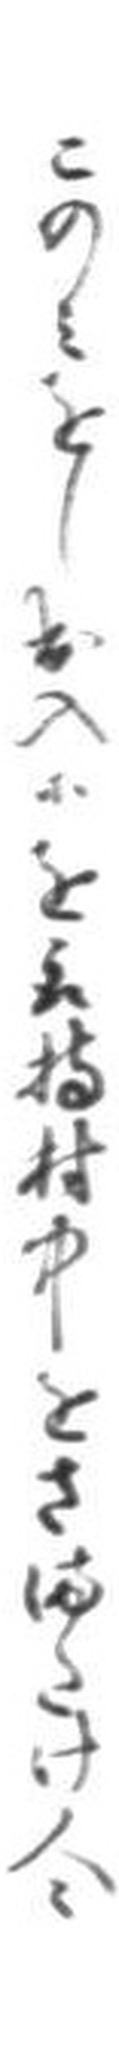このみをし出入等を取持村中をさまたけ人々
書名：家譜 三十四 吉邦公 従享保五年到同六年
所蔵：福井県文書館 Fukui Prefectural Archives
